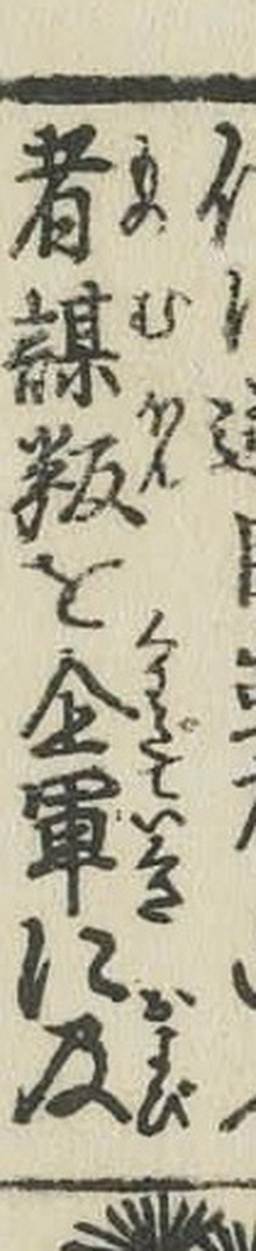者謀叛を企軍に及
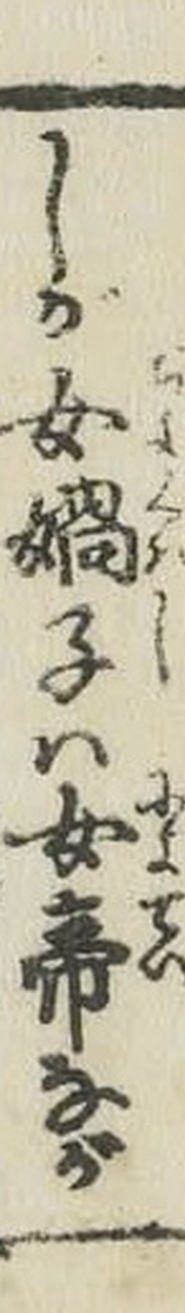しが女媧子は女帝なが
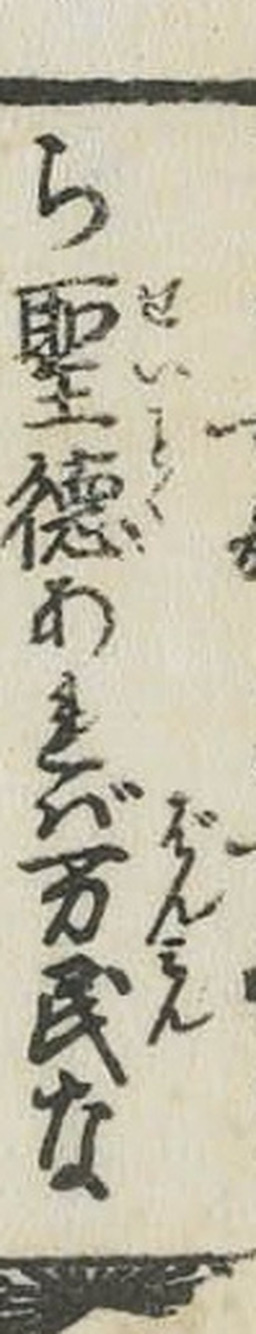ら聖徳あれば万民な
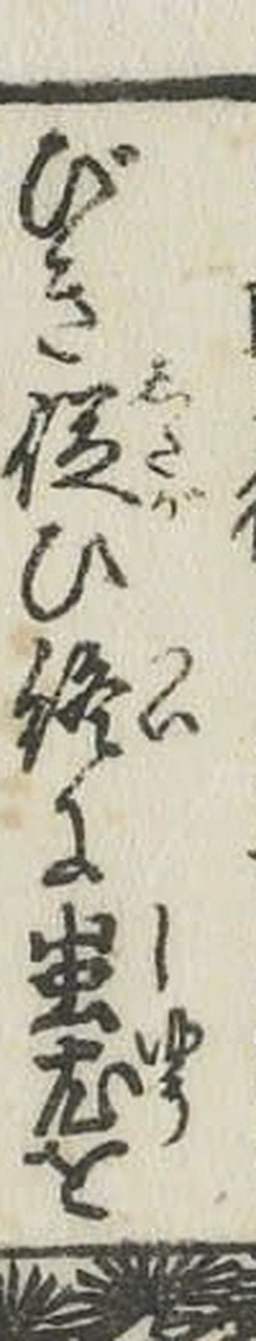びき従ひ終に蚩尤を
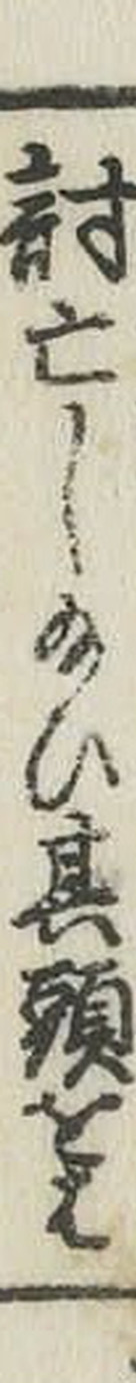討亡し給ひ其頭をは
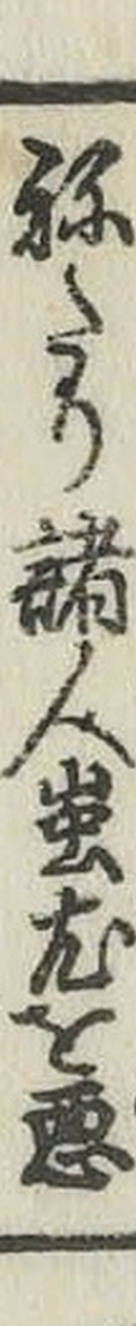ねたり諸人蚩尤を悪
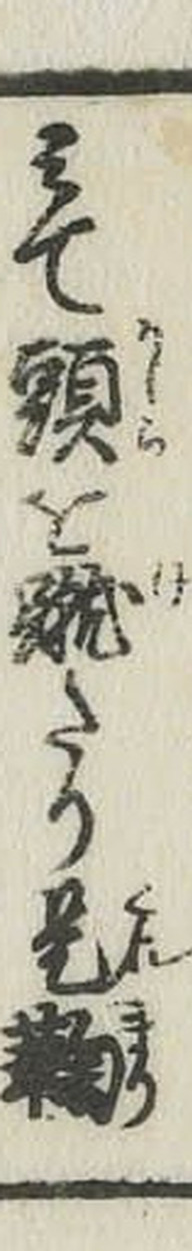みて頭を蹴たり是鞠
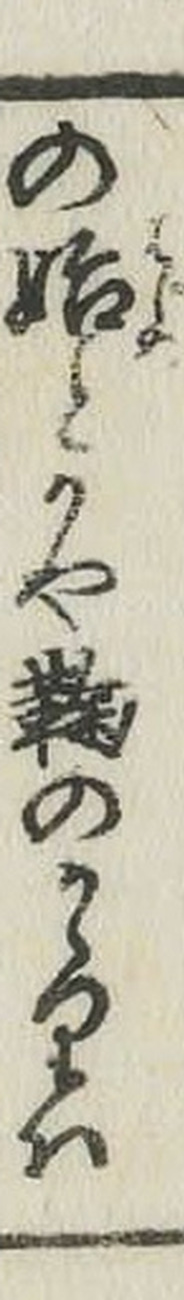の始とかや鞠のかゝりは
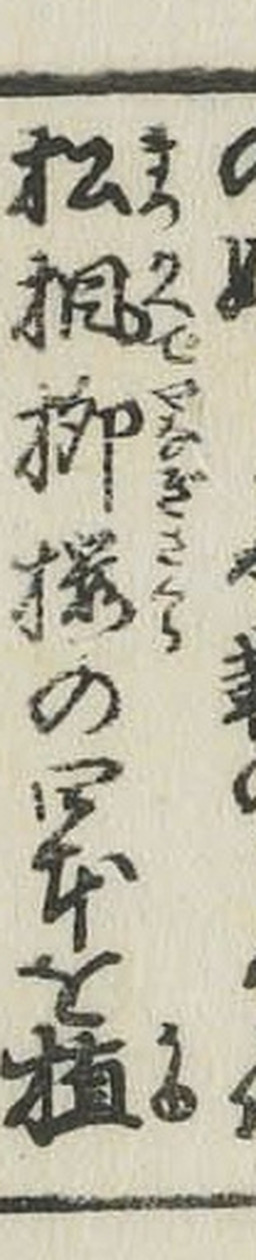松楓柳桜の四本を植
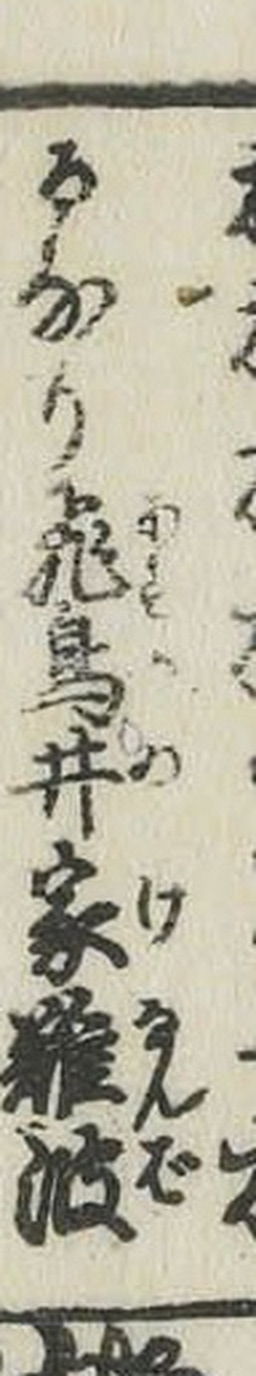るなり飛鳥井家難波
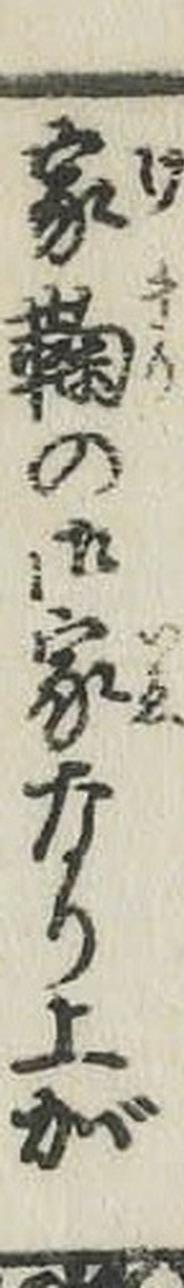家鞠の御家なり上が
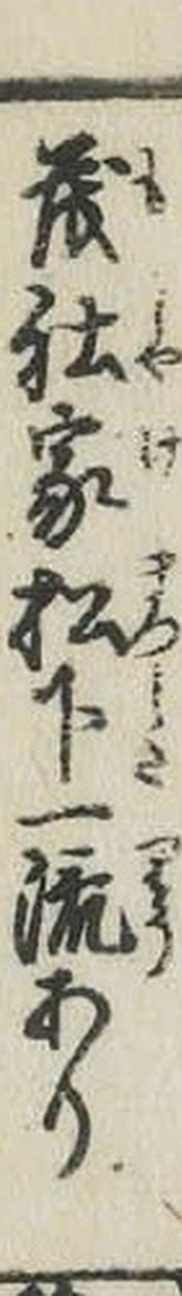茂社家松下一流あり

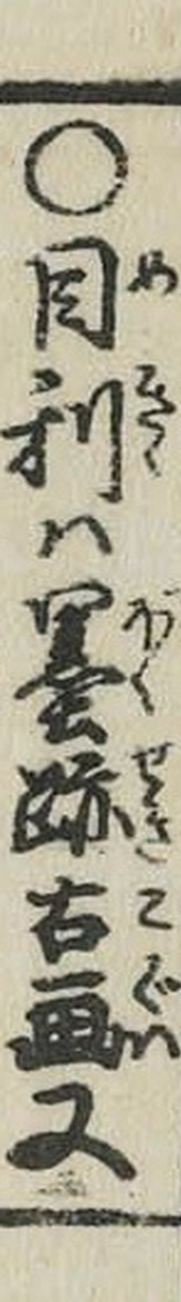○目利は墨跡古画又
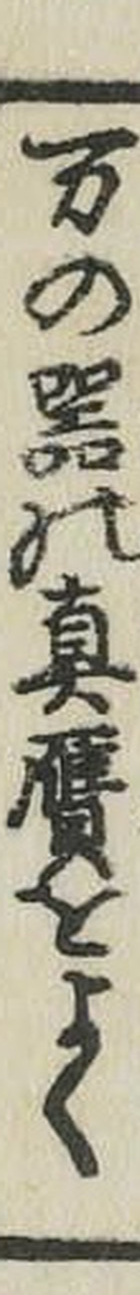万の器の真贋をよく
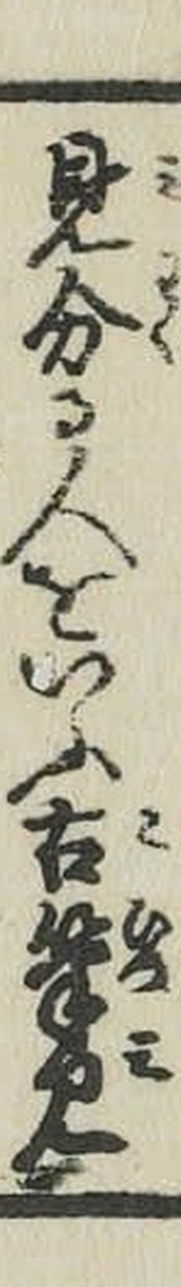見分る人をいふ古筆見
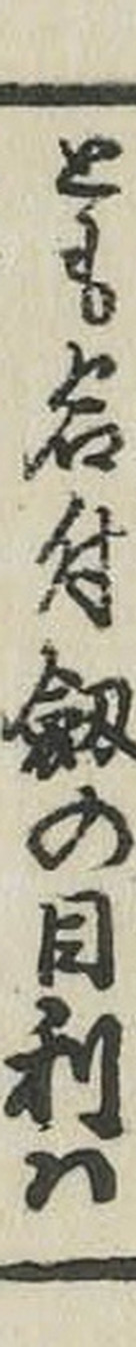とも名付剣の目利は
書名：増補頭書訓蒙図彙大成 10巻 10:巻之21
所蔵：東京学芸大学教育コンテンツアーカイブ
